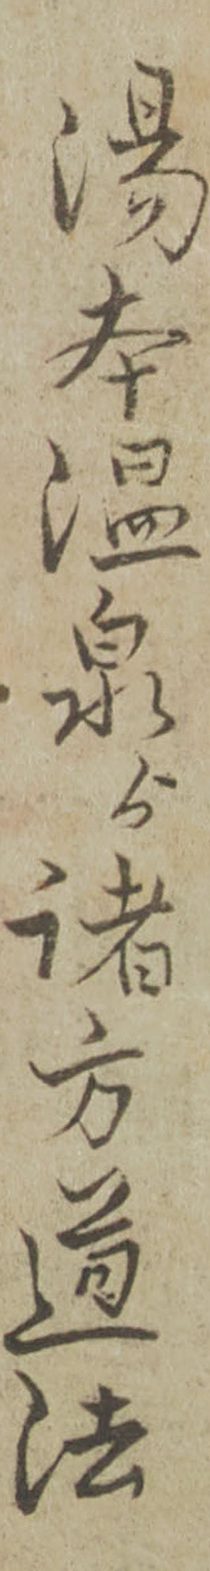湯本温泉より諸方道法
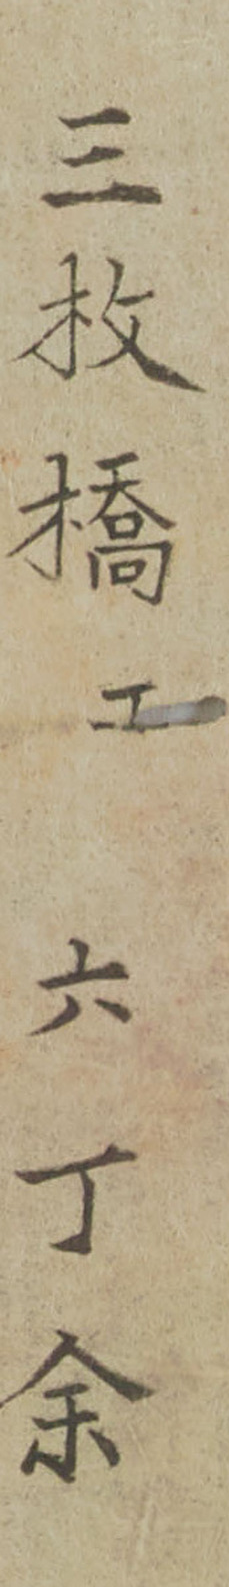三枚橋エ六丁余
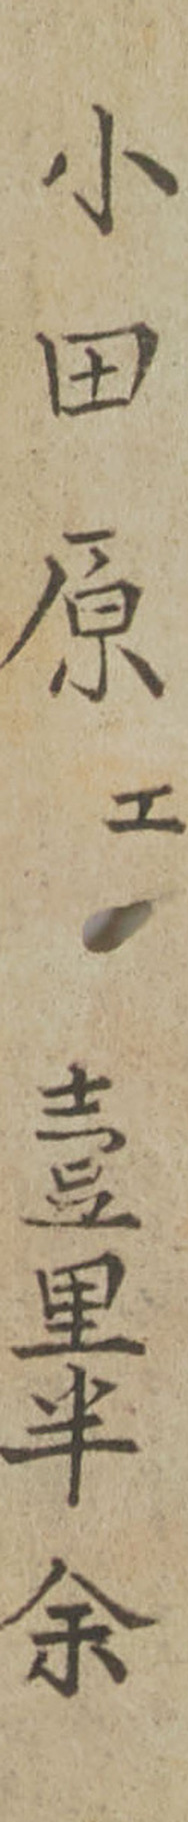小田原エ一里半余
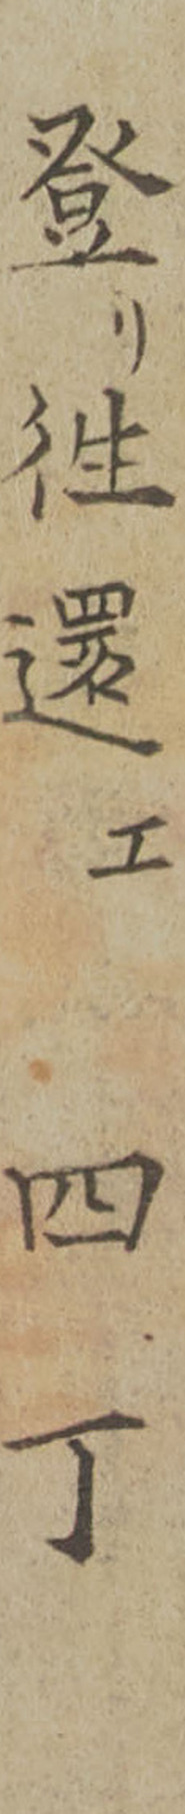登リ往還エ四丁
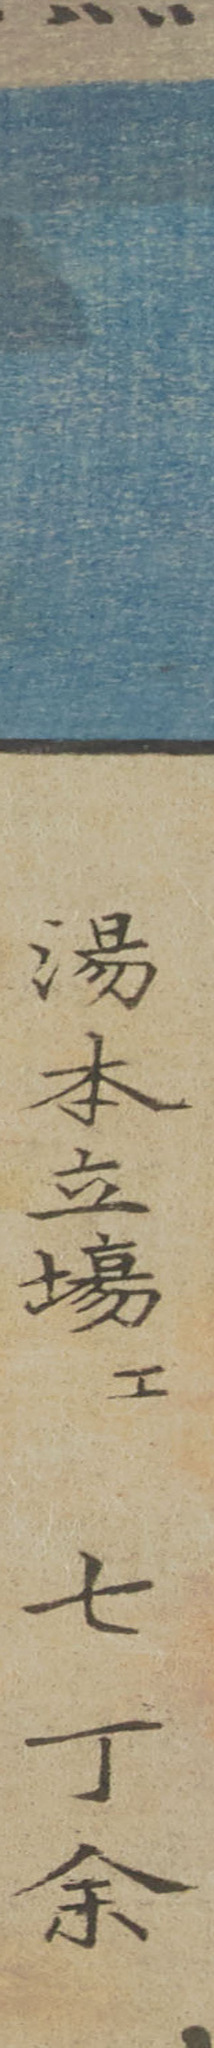湯本立場エ七丁余
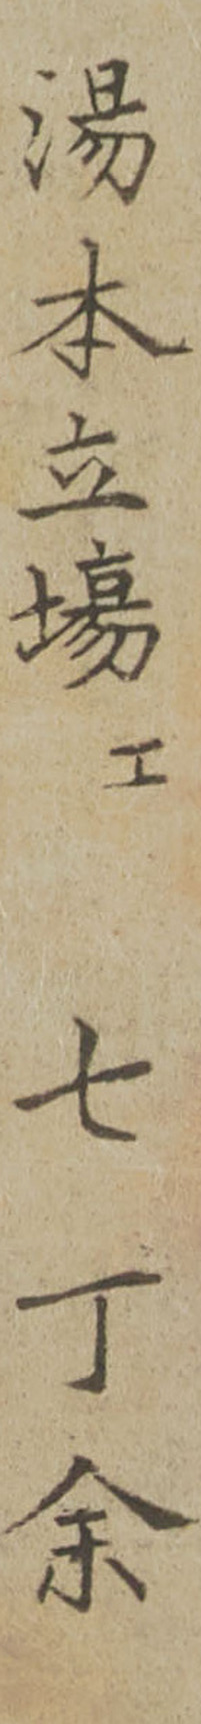湯本立場エ七丁余
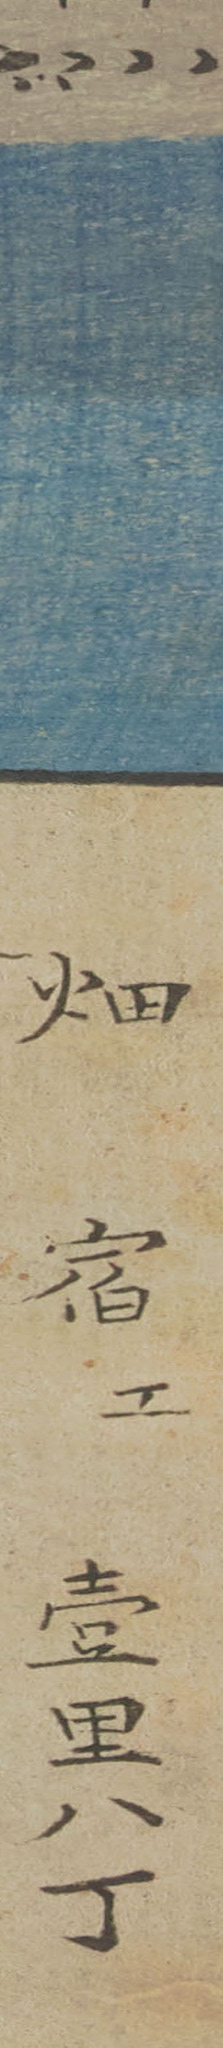畑宿エ一里八丁
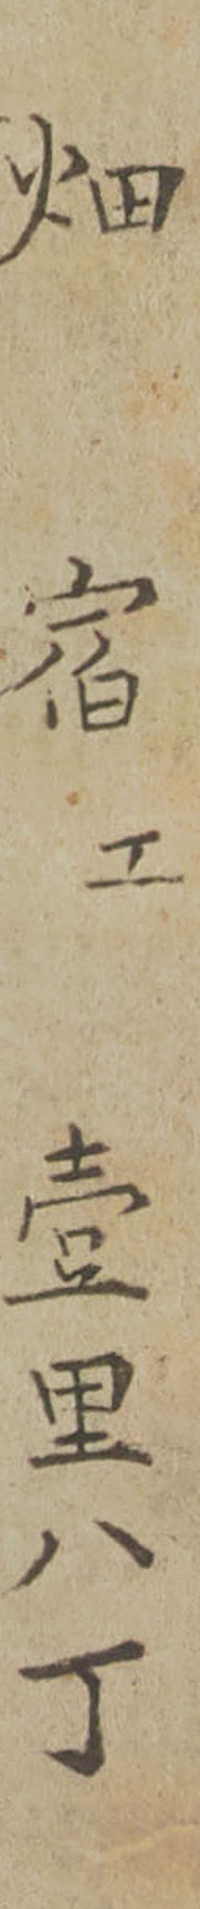畑宿エ一里八丁
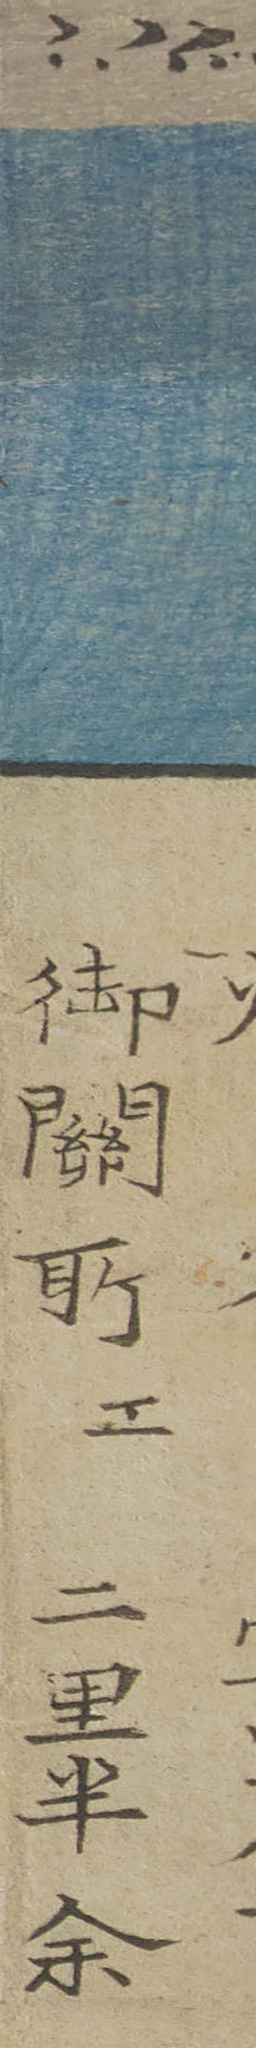御関所エ二里半余
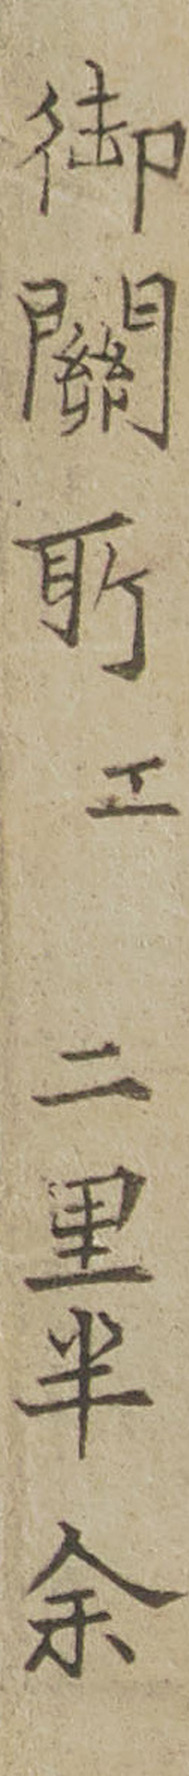御関所エ二里半余
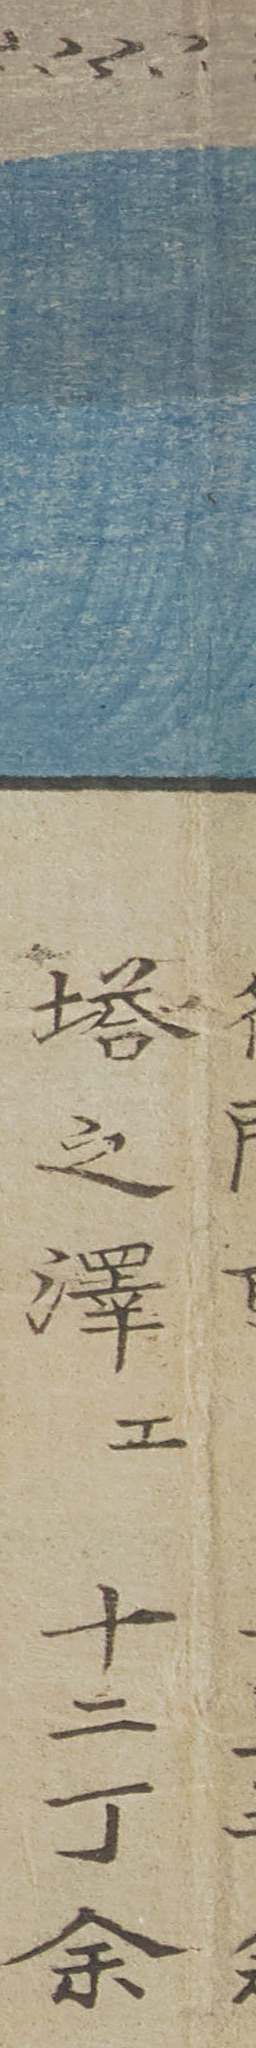塔之沢エ十二丁余
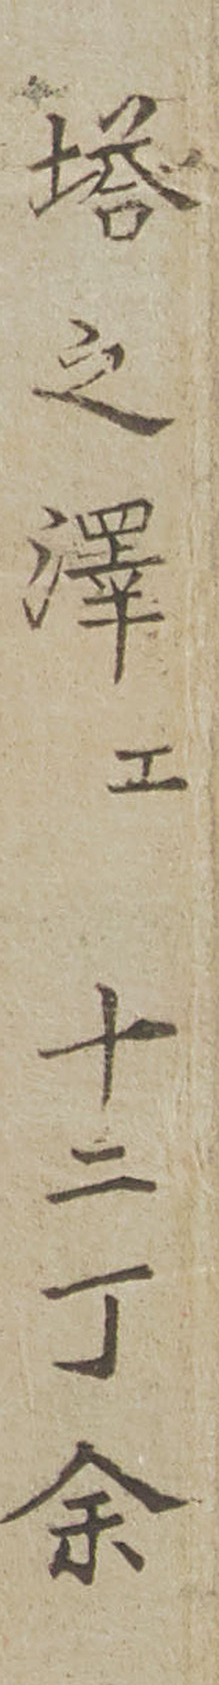塔之沢エ十二丁余
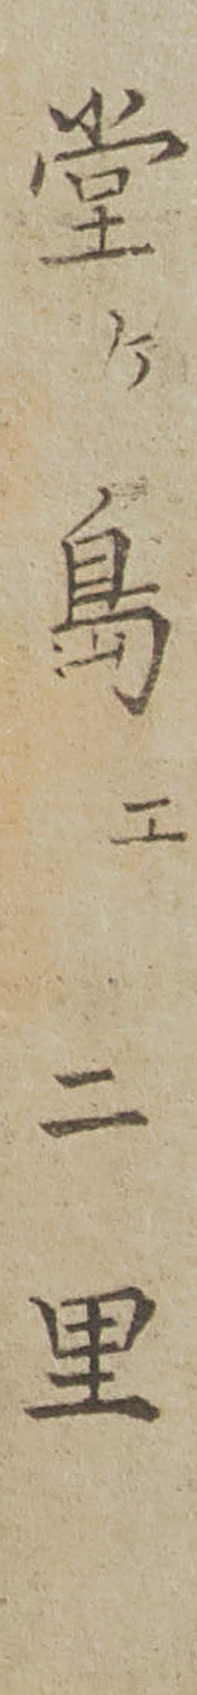堂ヶ島エ二里
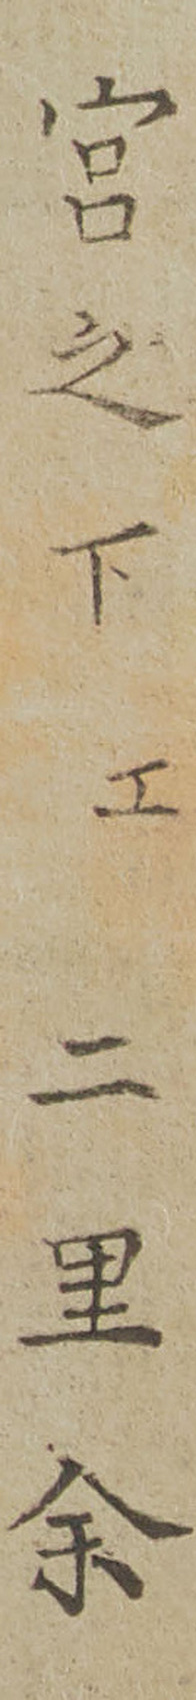宮之下エ二里余
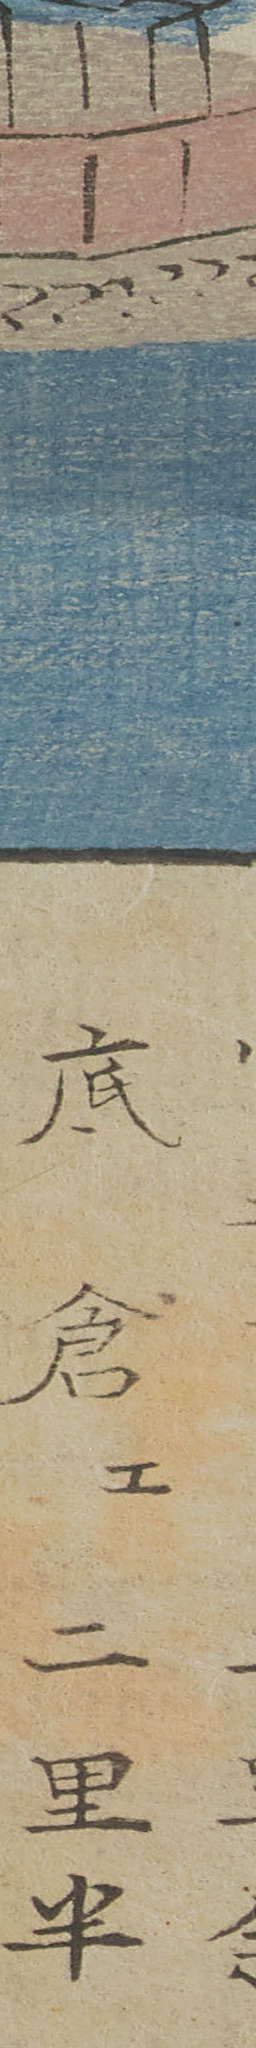底倉エ二里半
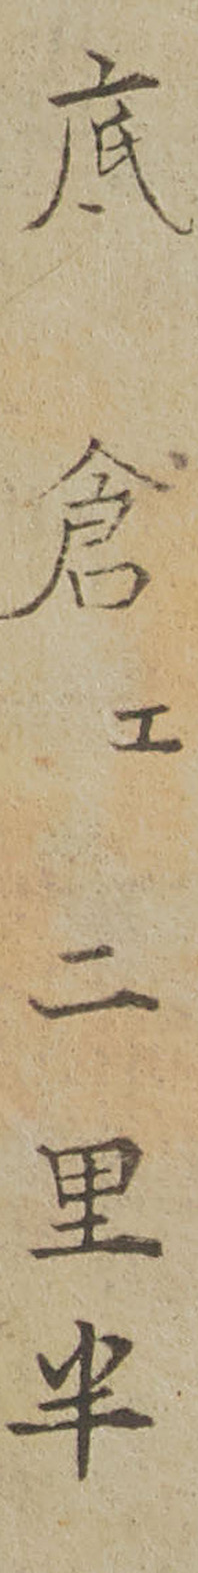底倉エ二里半
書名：湯本温泉より諸方道法
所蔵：東京大学総合図書館 General Library in the University of Tokyo, JAPAN
